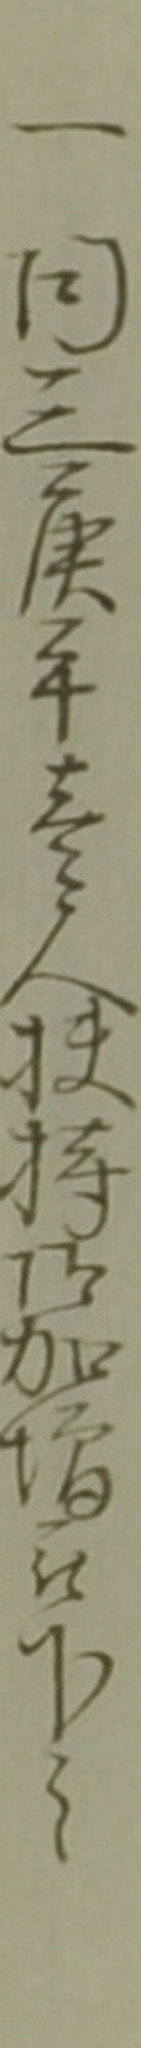一同三庚午壱人扶持御加増被下之
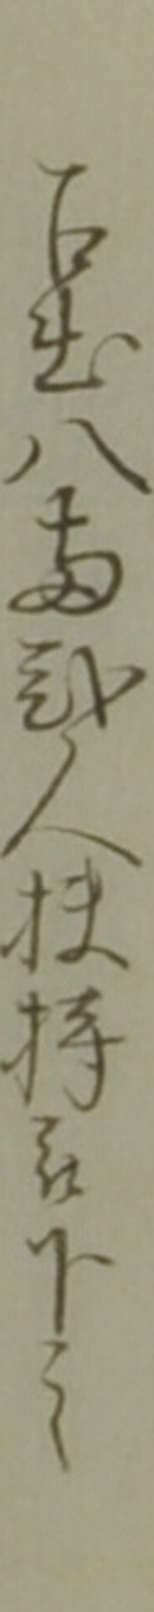召出八両弐人扶持被下之
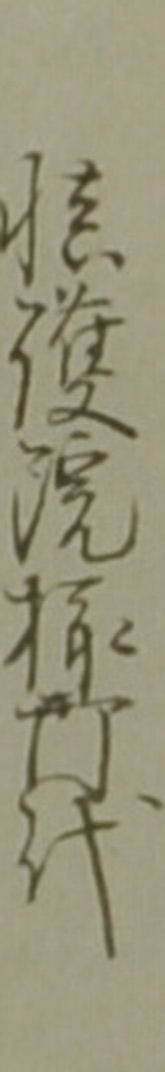慎護院様御代
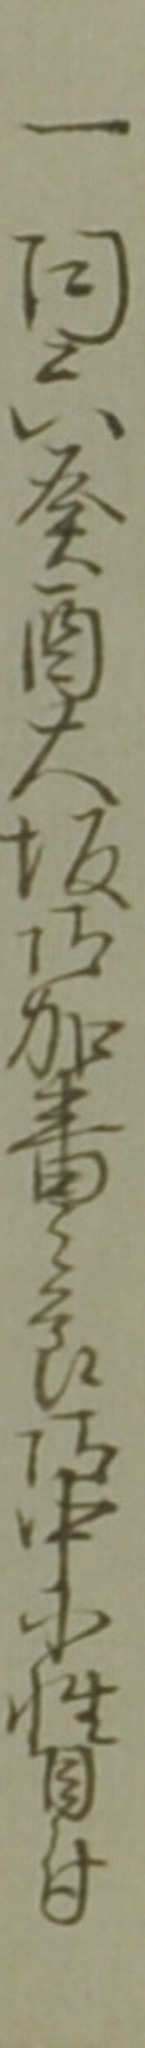一同六癸酉大坂御加番之節御中小性目付
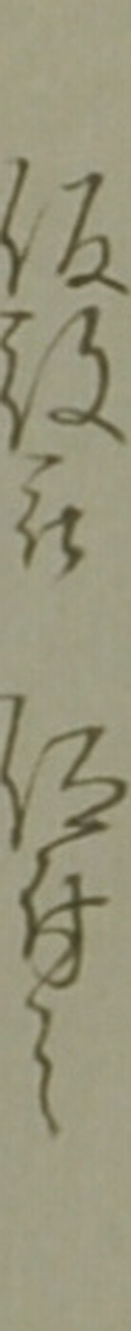仮役被仰付之
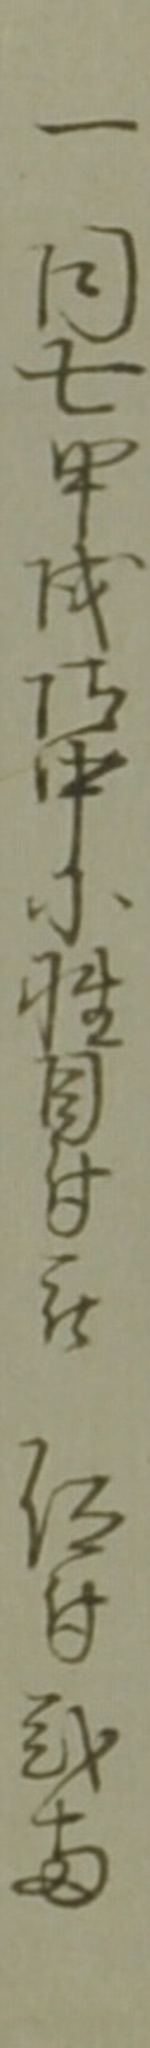一同七甲戌御中小性目付被仰付弐両
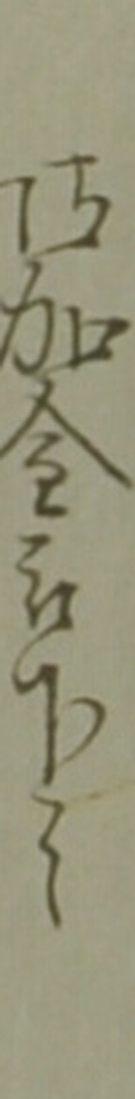御加金被下之
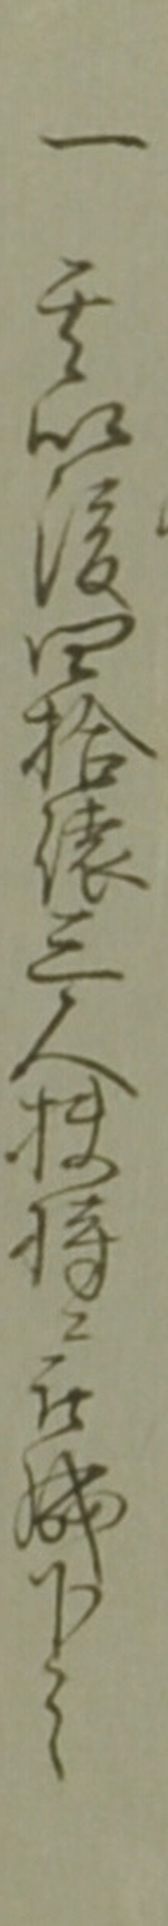一其以後四拾俵三人扶持ニ被成下之
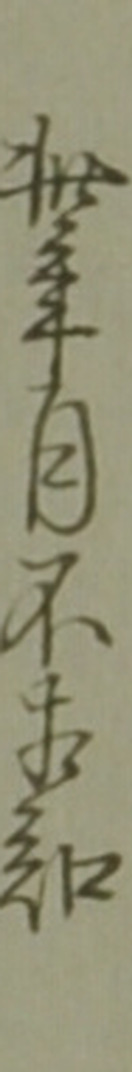此年月不相知
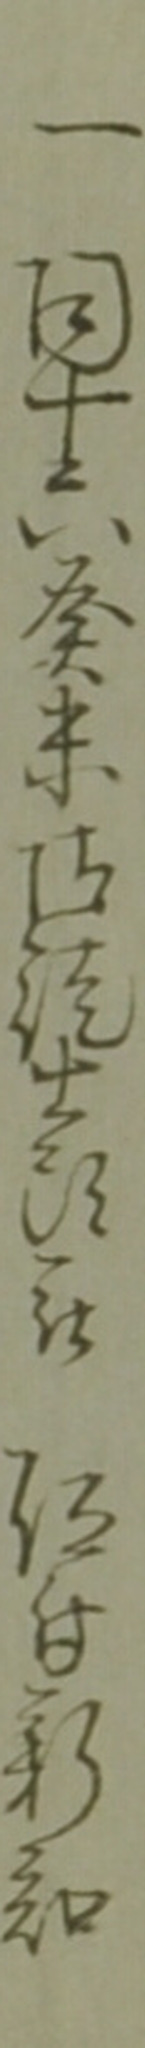一同十六癸未御徒士頭被仰付新知
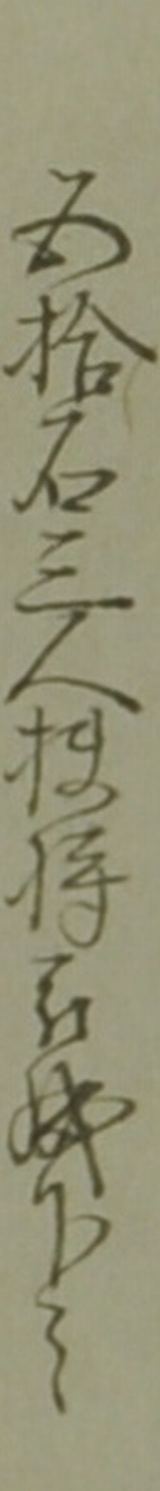五拾石三人扶持被成下之
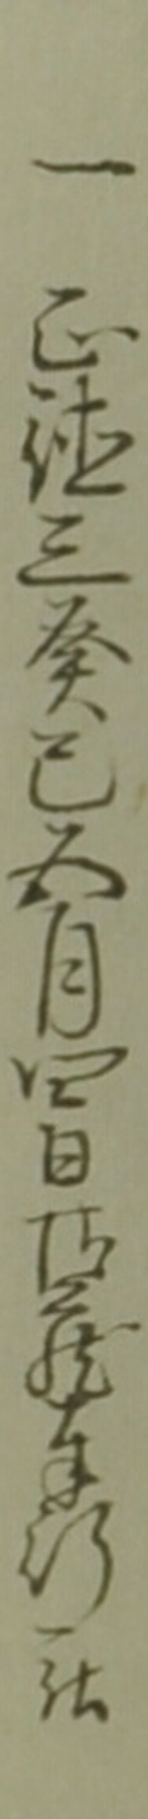一正徳三癸巳五月四日御蔵奉行被
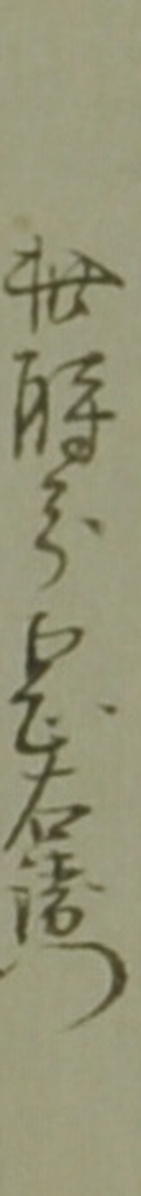此時分岡右衛門

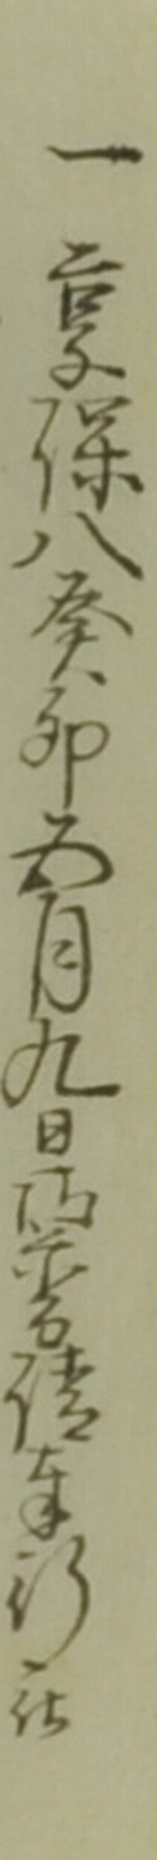一享保八癸卯五月九日御普請奉行被
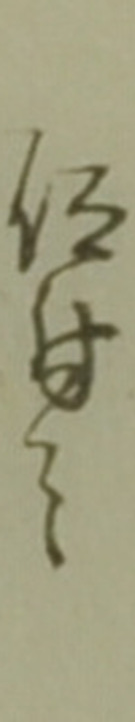仰付之
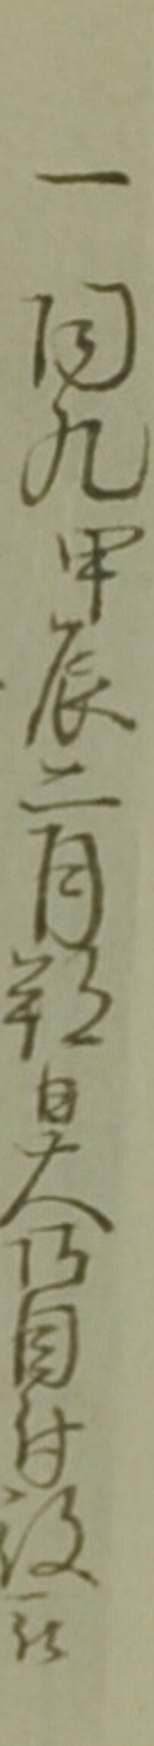一同九甲辰二月朔日大御目付役被
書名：給人諸士勤仕録（三）
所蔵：伊那市立高遠町図書館・合同会社AMANE
